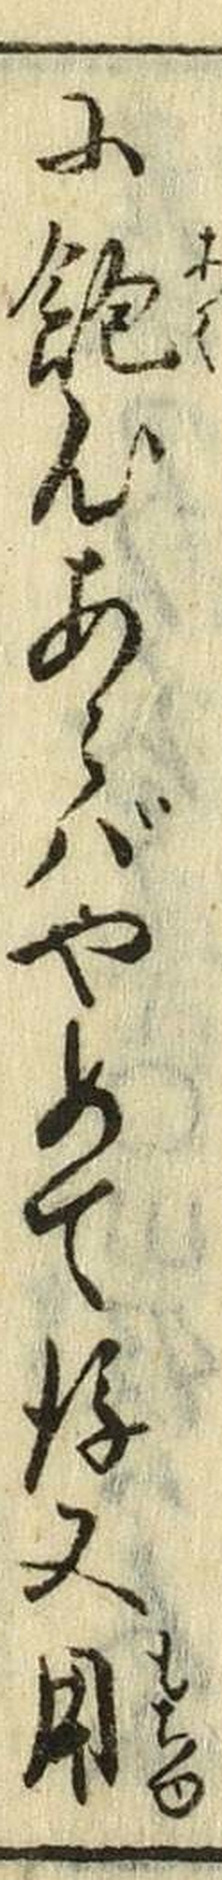に飽心あらばやめて後又用
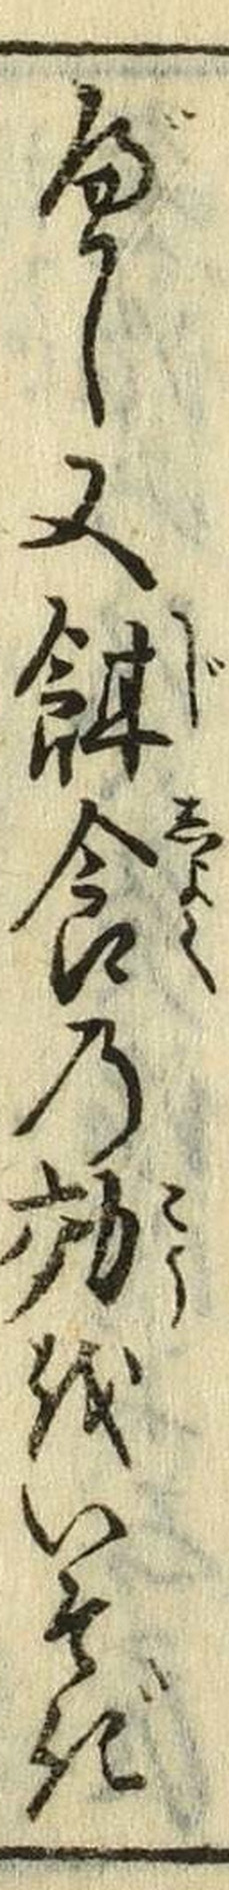べし又餌食の効をいそぎ
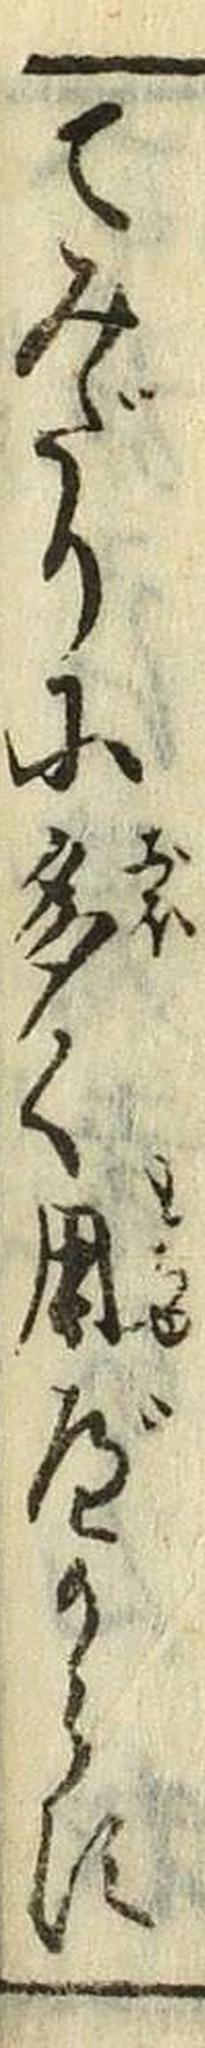てみだりに多く用べからす
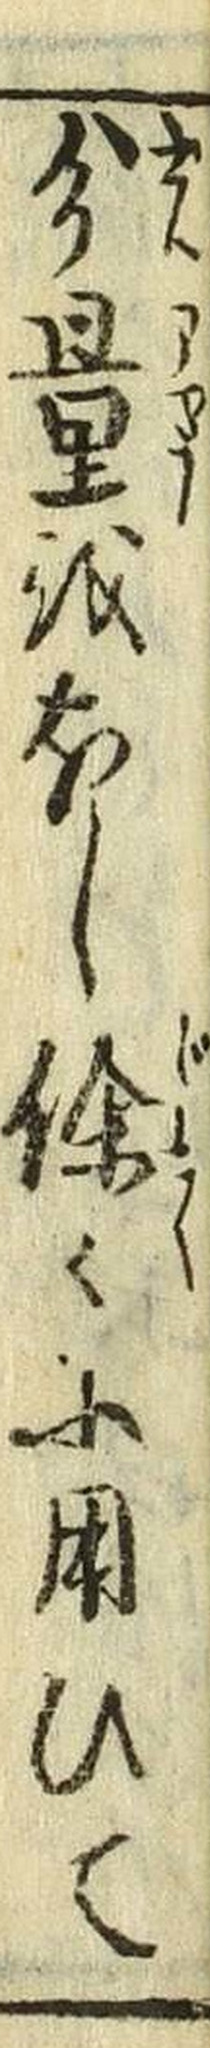分量をなし徐々に用ひて
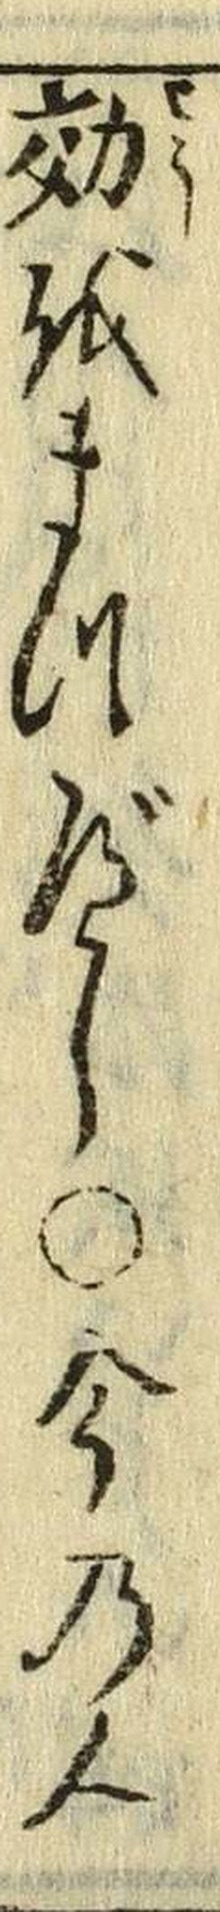効をまつべし○今の人
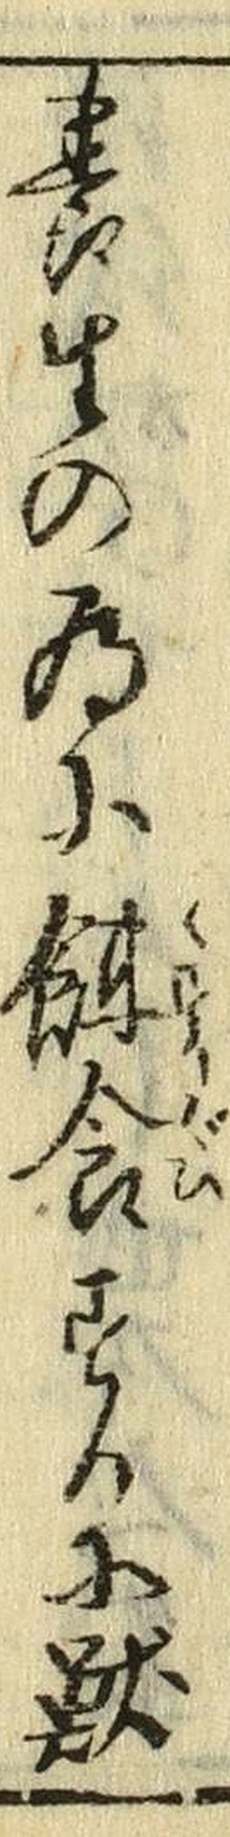養生の為に餌食するに獣
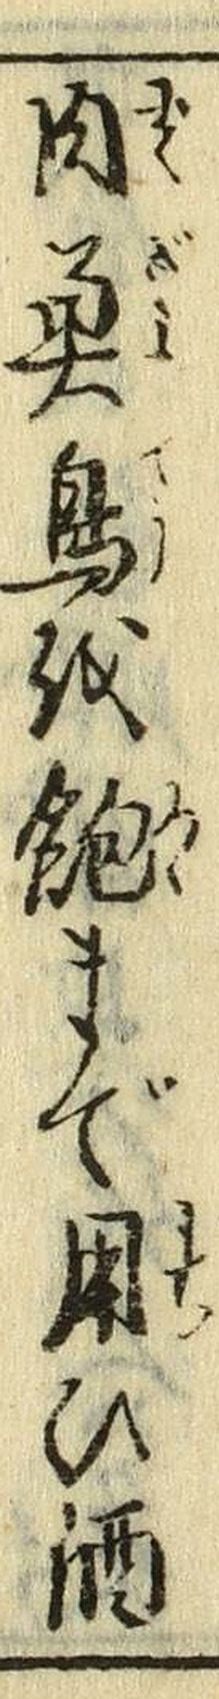肉魚鳥を飽まで用ひ酒
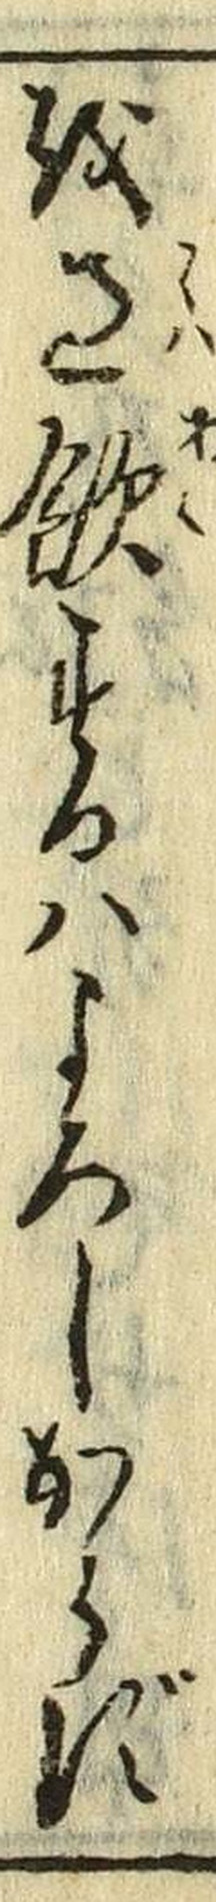を過飲するはよろしからず
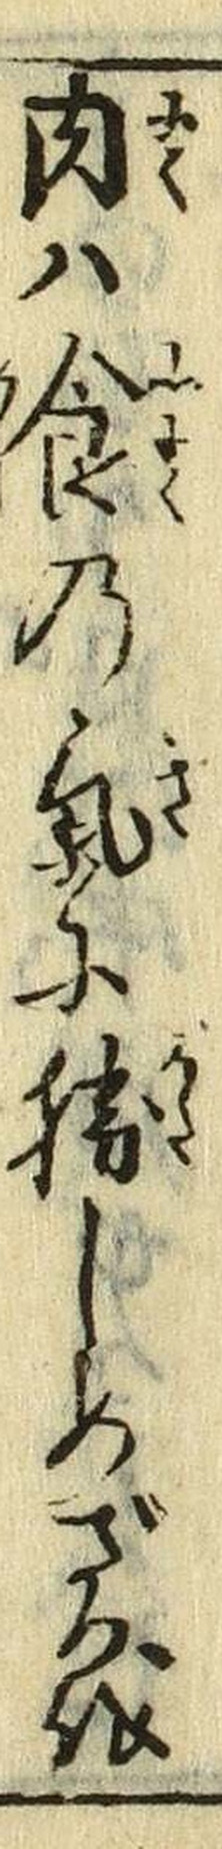肉は食の気に勝しめざるを
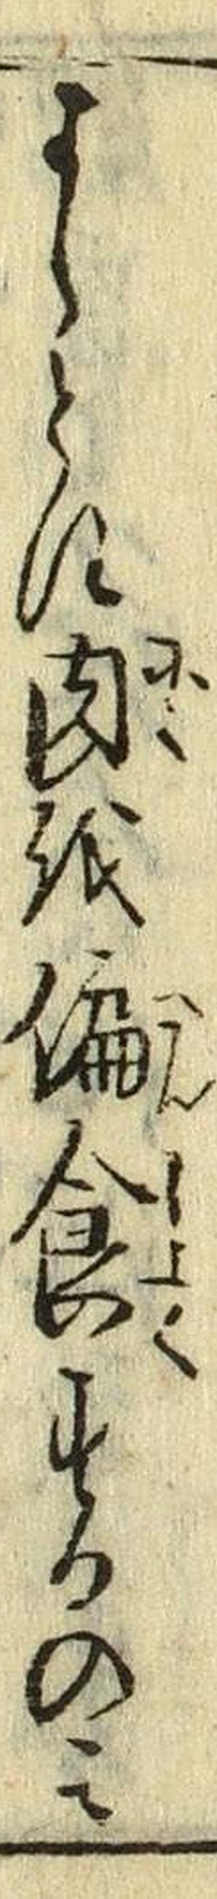よしとす肉を偏食するのみ
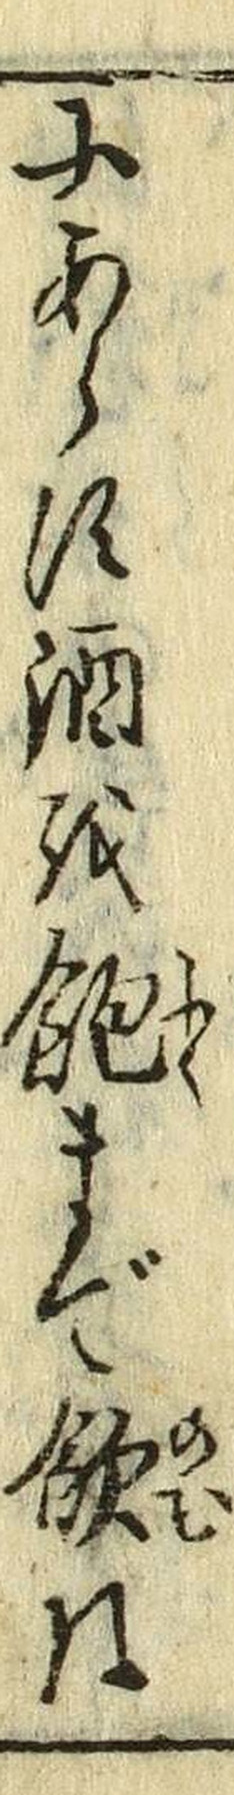にあらす酒を飽まで飲は
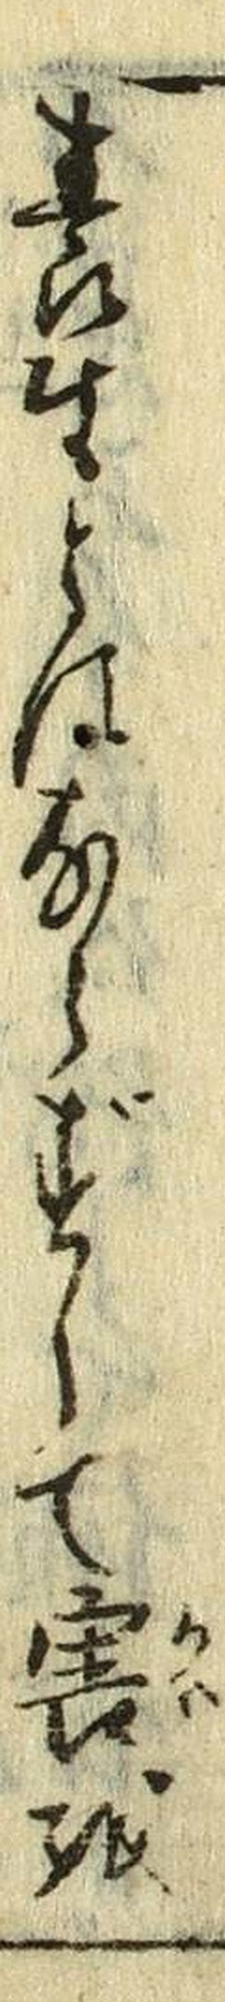養生とはならずして害を
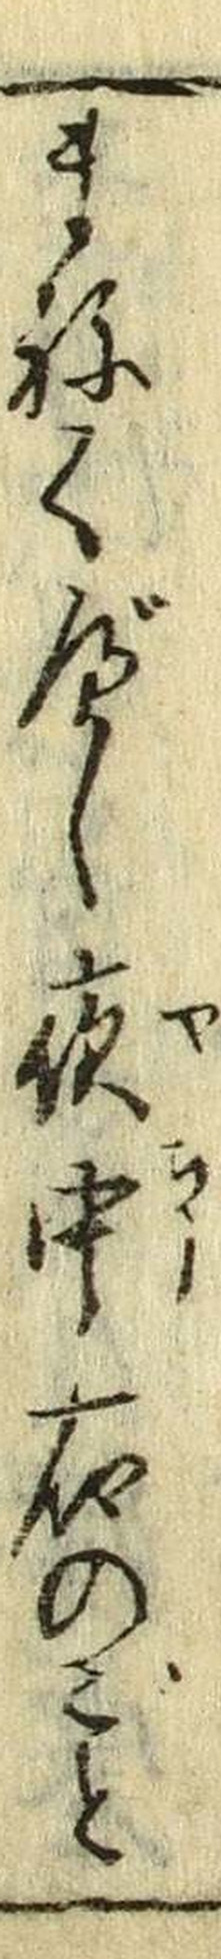まねくべし夜中右のごと
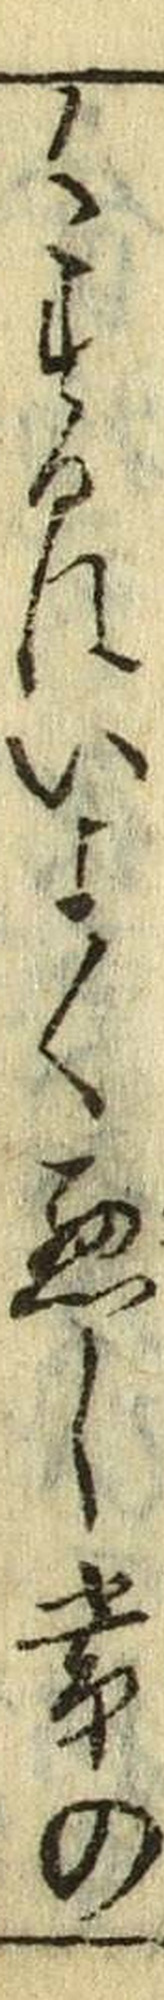くするはいよ〳〵悪し常の

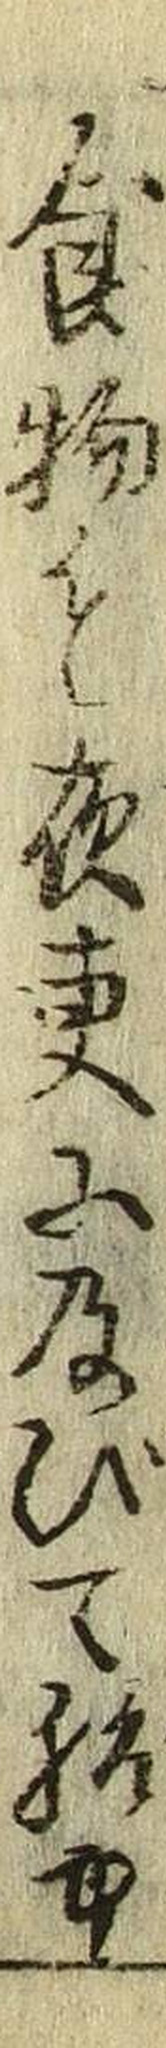食物を夜更に及びて腹中
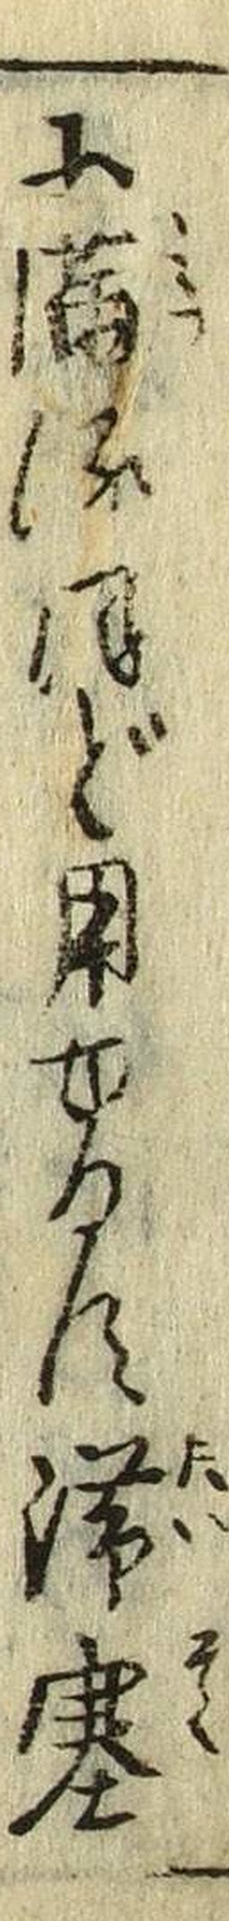に満るほど用ゆるす滞塞
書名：居家養生記
